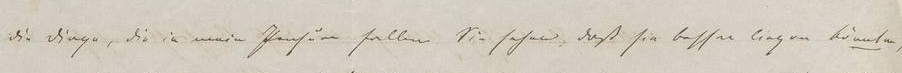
die Dinge, die in mein Pensum fallen. Sie sehen, daß sie besser liegen könnten,
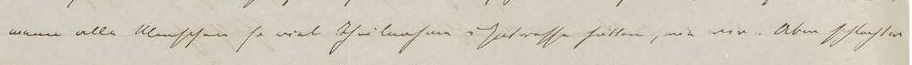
wenn alle Menschen so viel Theilnahme u Interesse hätten, wie wir. Aber schlechter
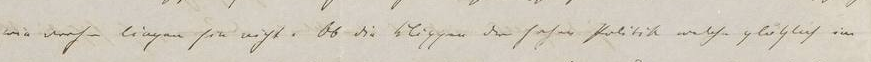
wie vorher liegen sie nicht. Ob die Klippen der hohen Politik welche plötzlich im
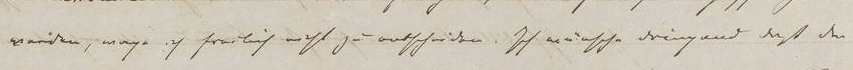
würden, wage ich freilich nicht zu entscheiden. Ich wünsche dringend daß der-
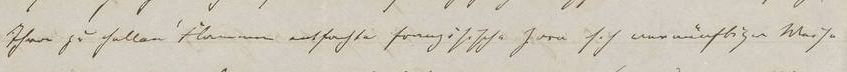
Thron zu hellen Flammen entfachte französische Zorn sich vernünftiger Weise
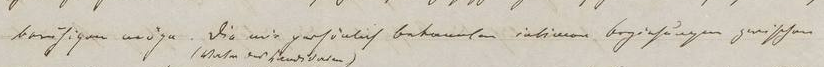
beruhigen möge. Die mir persönlich bekannten intimen Beziehungen zwischen
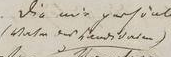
hiesigen Fürsten(Vater
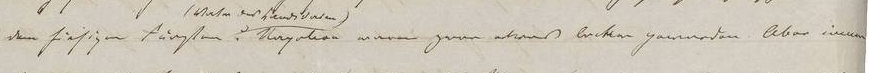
des Kandidaten) u Napoleon waren zwar etwas lockrer geworden. Aber immer-
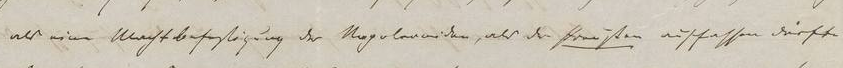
als eine Machtbefestigung der Napoleoniden, als der Preußen auffassen dürfte.
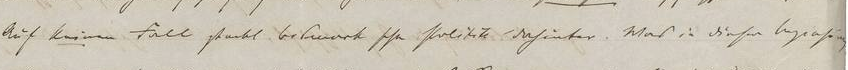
Auf keinen Fall steckt Bismarksche Politik dahinter. Was in dieser Beziehung
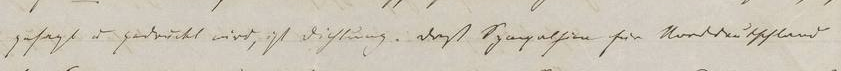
gesagt u gedruckt wird, ist Dichtung. Daß Sympathien für Norddeutschland
